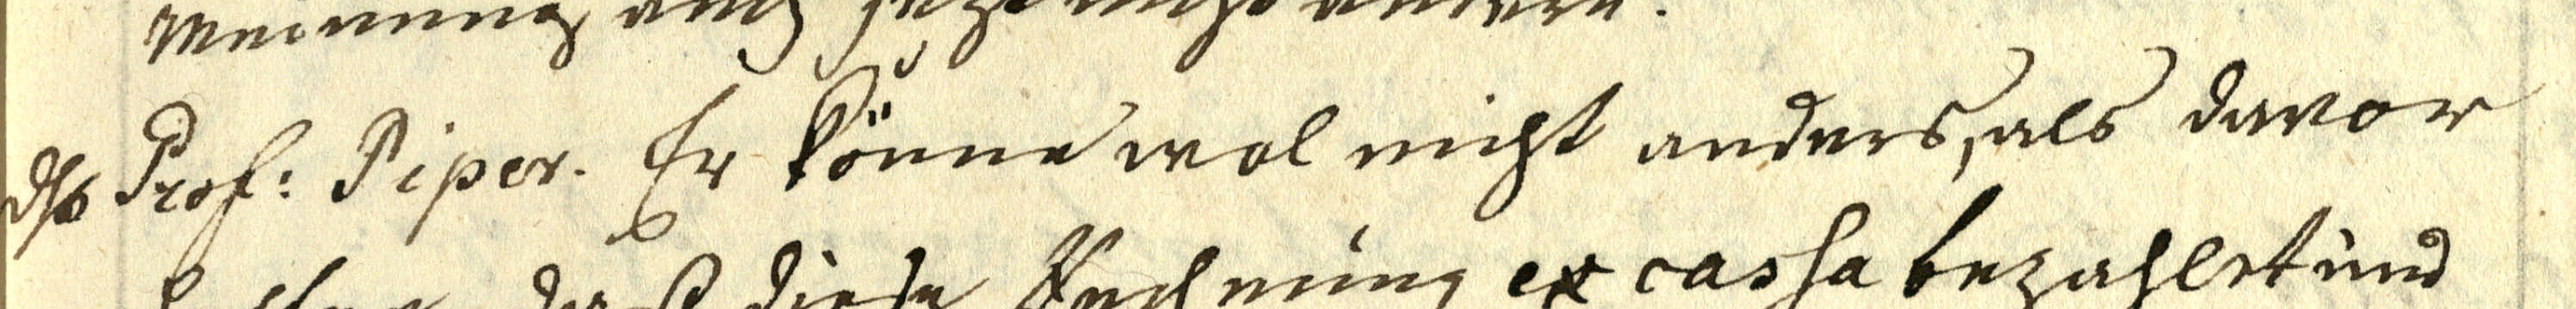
dh Prof. Piper. Er könne wol nicht anders, als davor
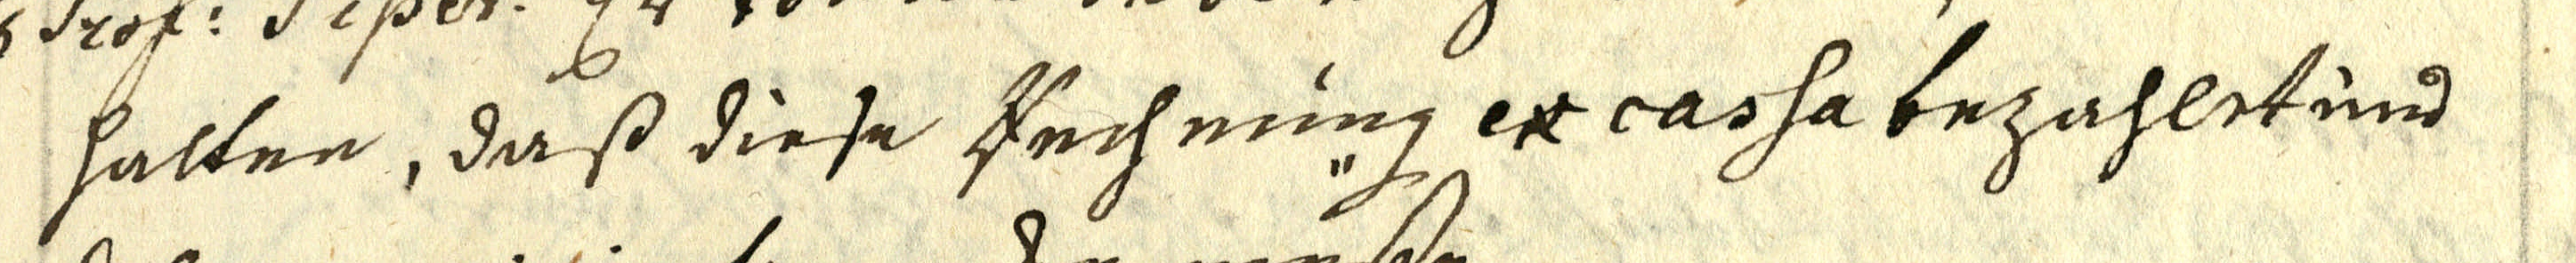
halten, daß diese Rechnung ex cassa bezahlet und
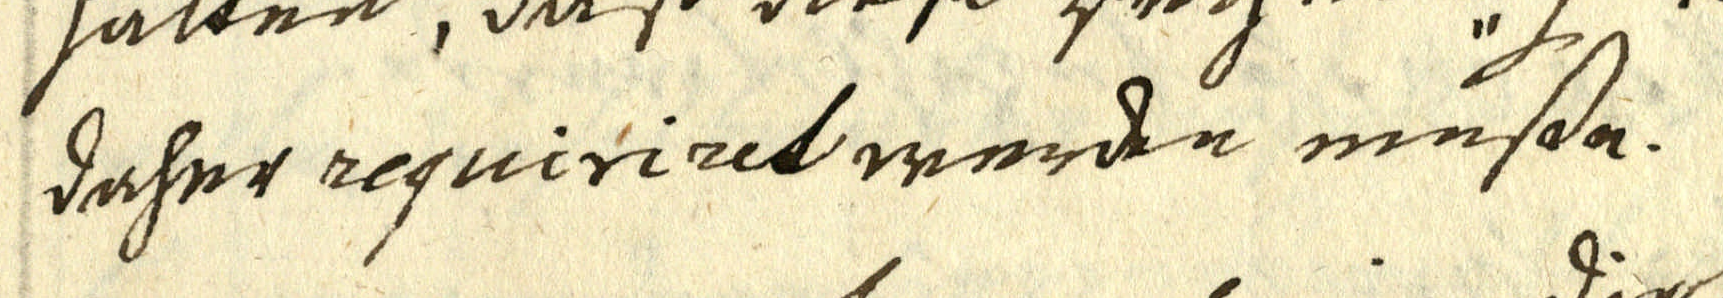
daher requiriret werden müße.
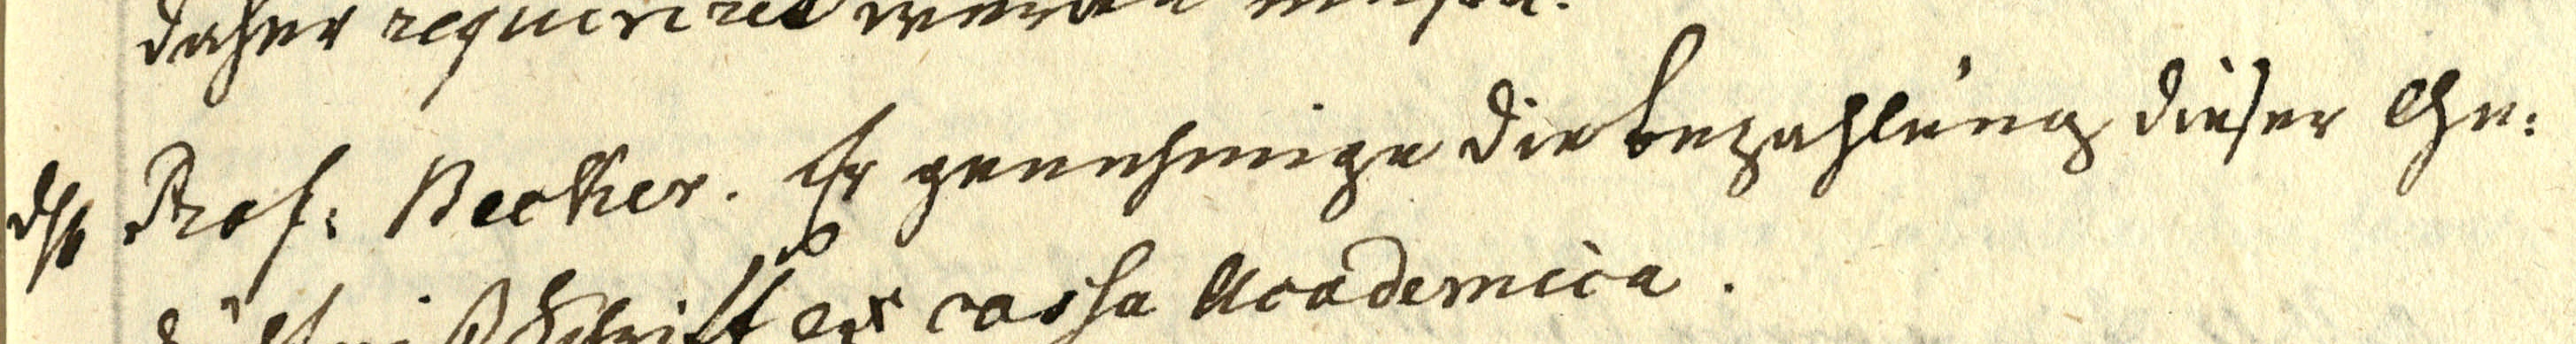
dh Prof. Becker. Er genehmige die Bezahlung dieser Ge¬
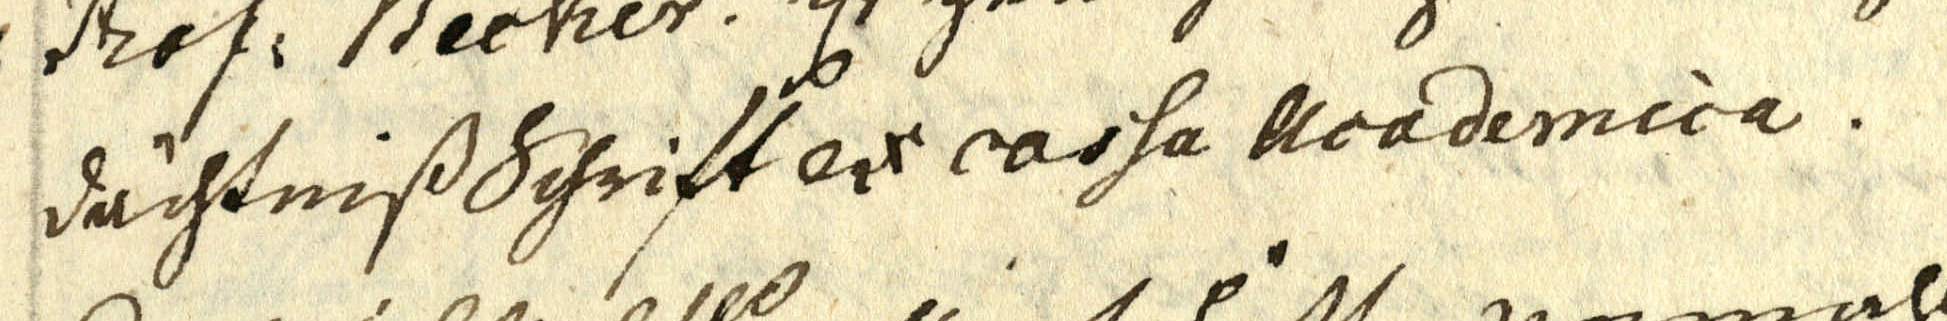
dächtniß Schrift ex cassa Academica.
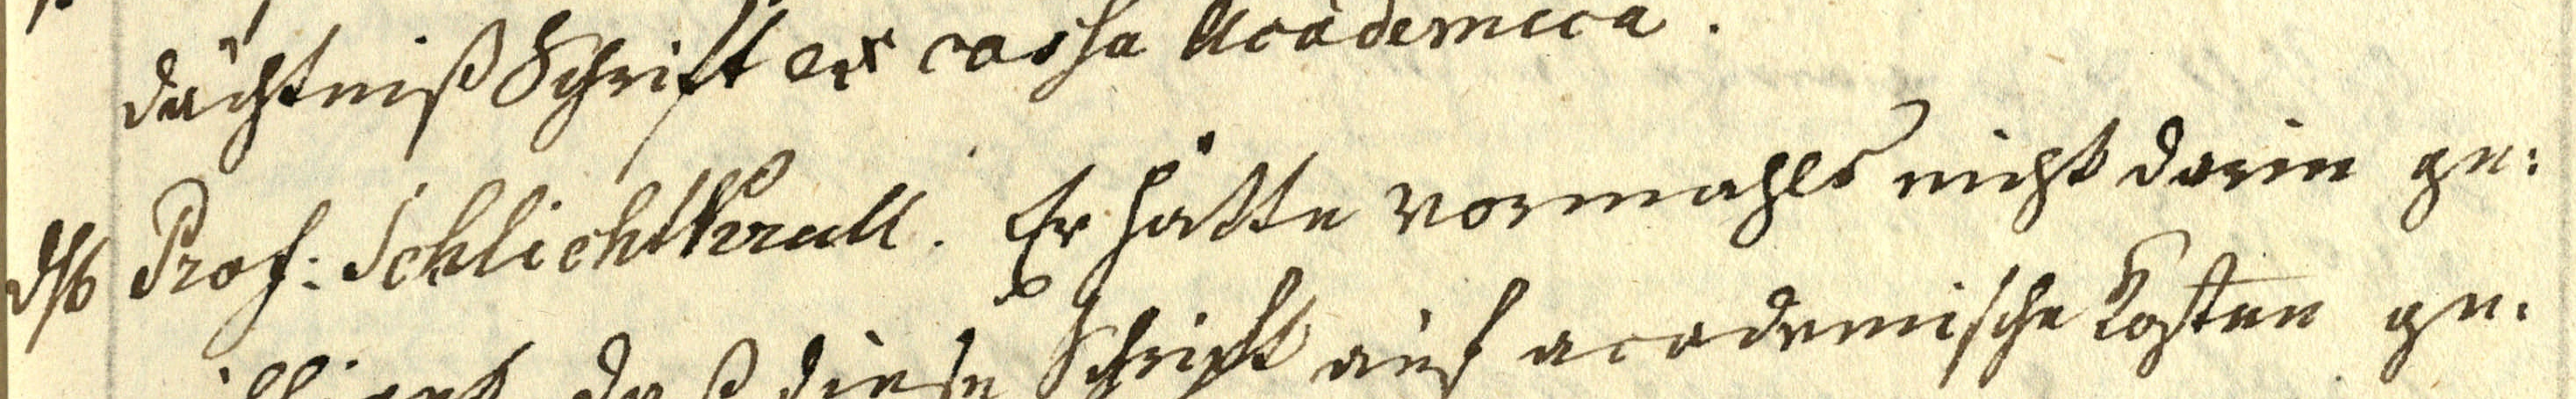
dh Prof. Schlichtkrull. Er hätte vormahls nicht darin ge¬
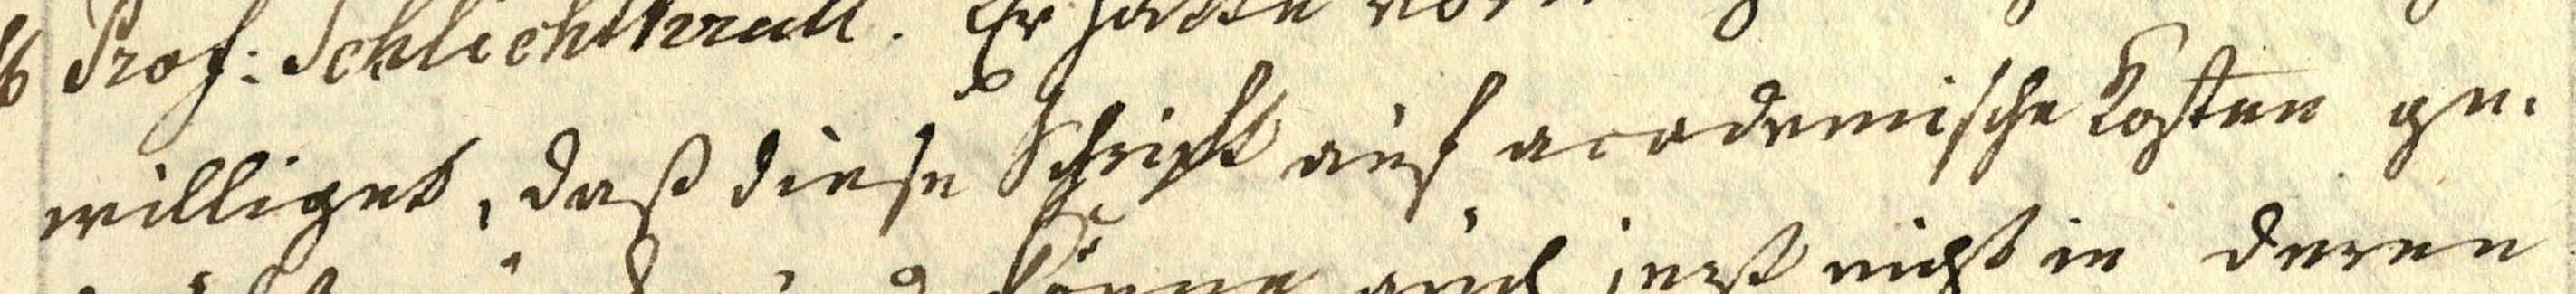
williget, daß diese Schrift auf academische Kosten ge¬
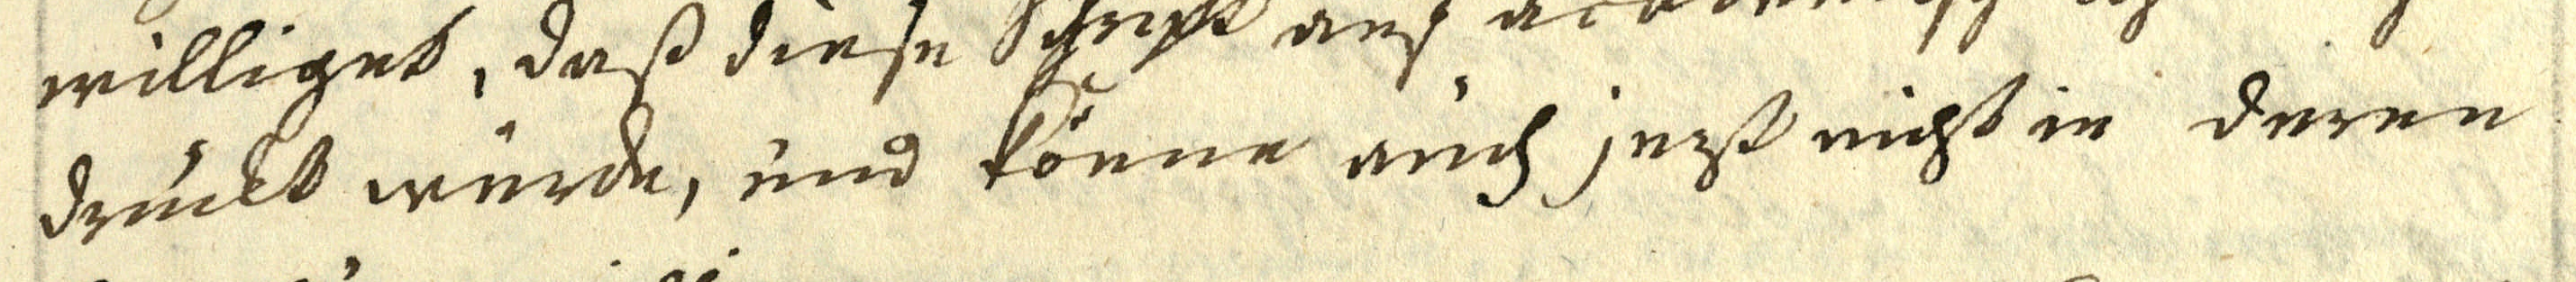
druckt würde, und könne auch jezt nicht in deren
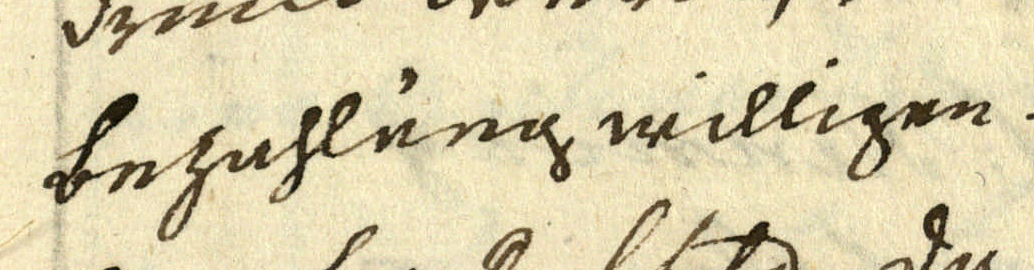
Bezahlung willigen.
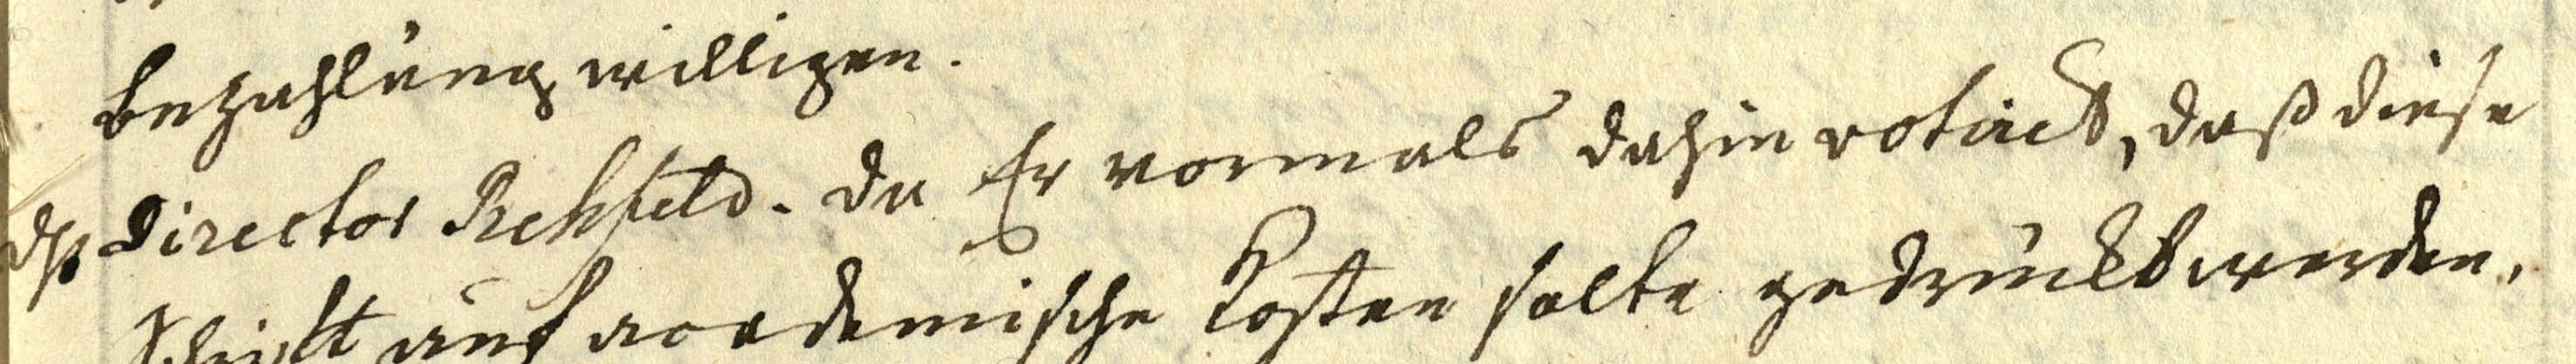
dh. Director Rehfeld. die Er vormals dahin votiret, daß diese
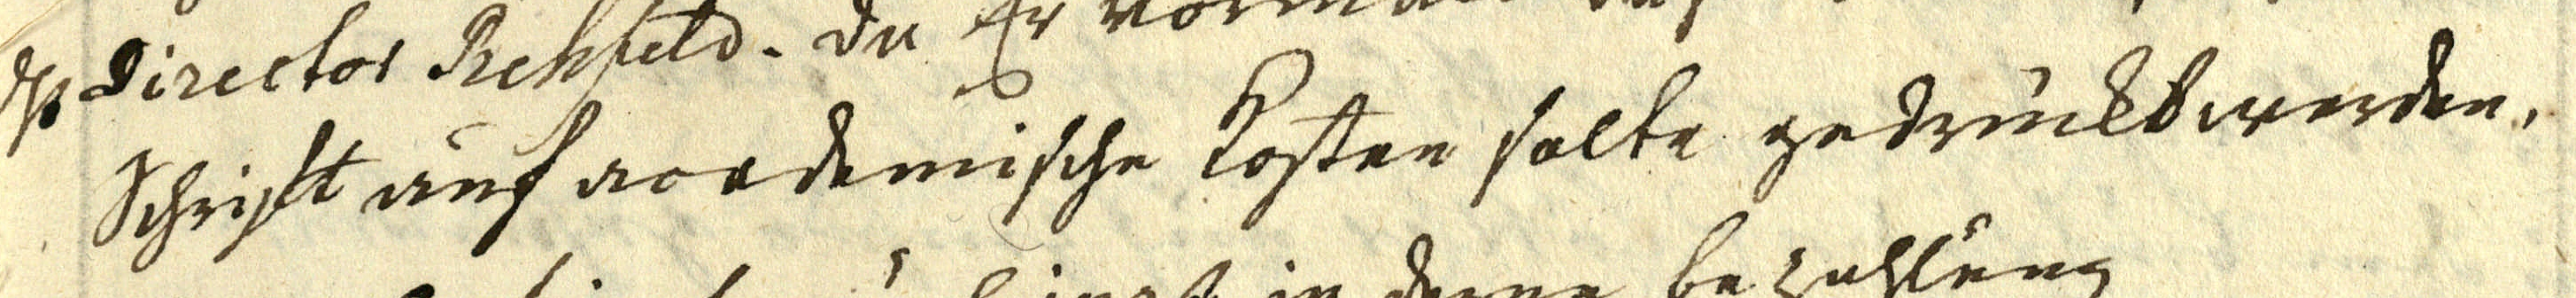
Schrift auf academische Kosten solte gedruckt werden,
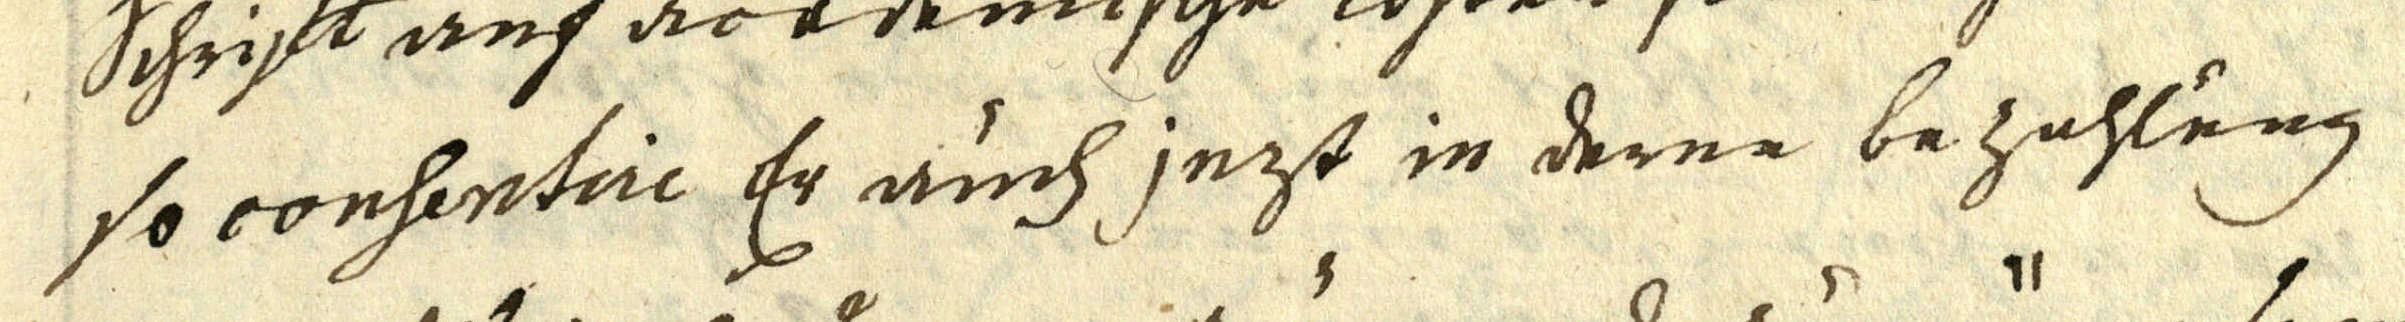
so consentire Er auch jezt in deren Bezahlung.
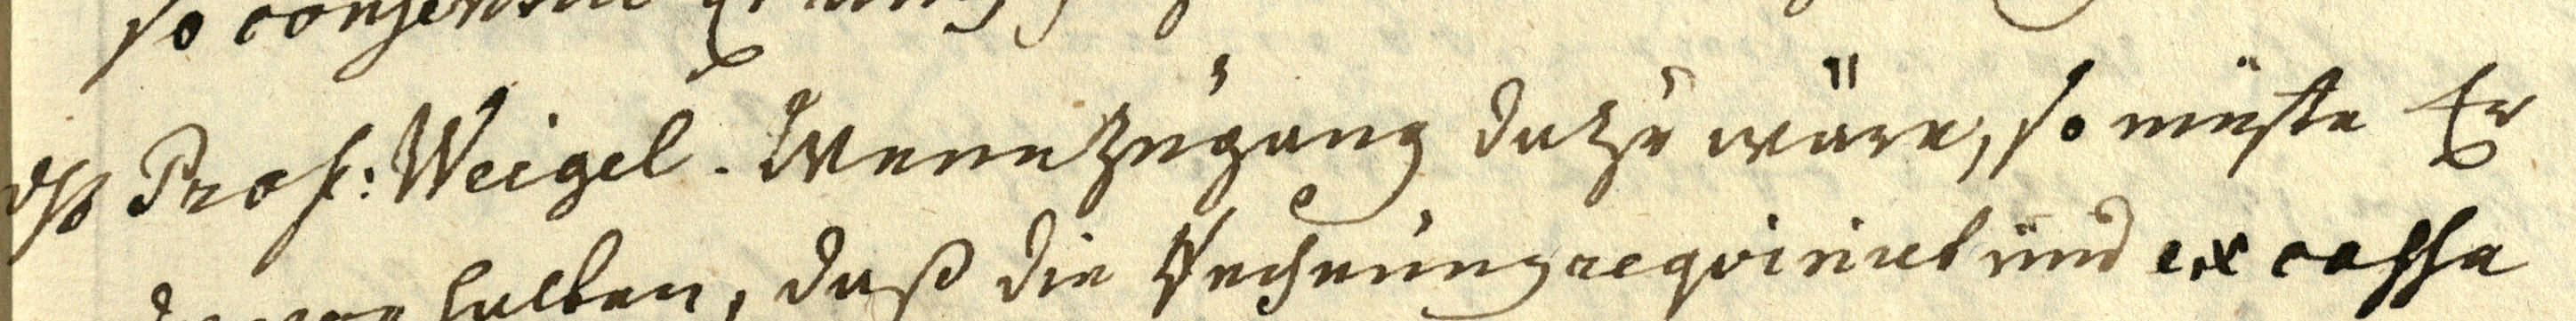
dh Prof. Weigel. Wenn Zugang dazu wäre, so müste Er
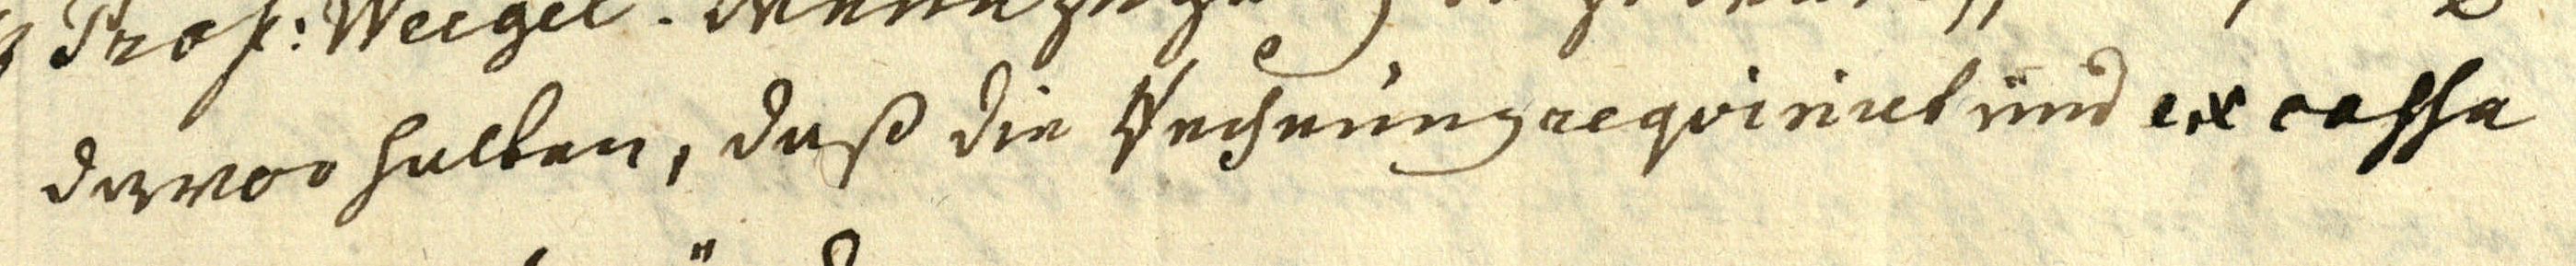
davor halten, daß die Rechnung requiriret und ex cassa
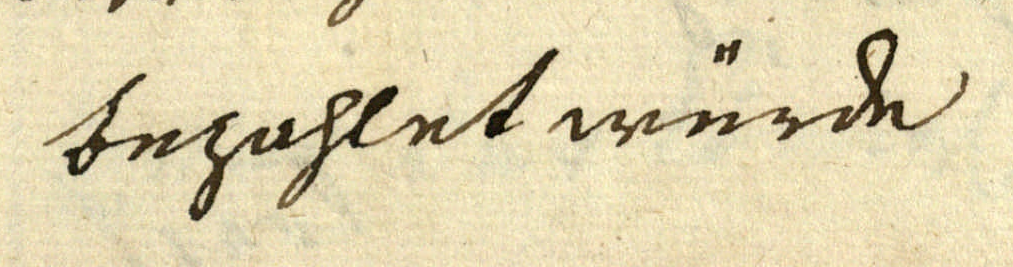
bezahlet würde.
